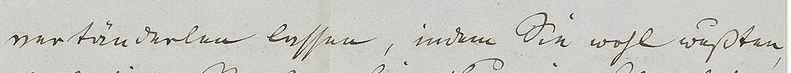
vertänderlen lassen, indem Sie wohl wußten,
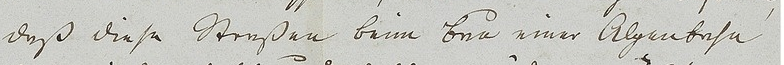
daß diese Straßen beim Bau einer Alpenbahn
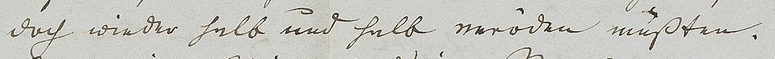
doch wieder halb und halb veröden mußten.
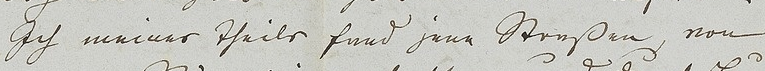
Ich meines Theils fand jene Straßen, von
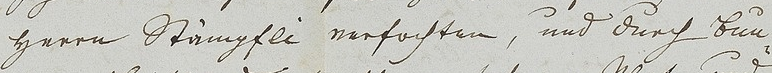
Herrn Stämpfli verfochten, und durch Bun-
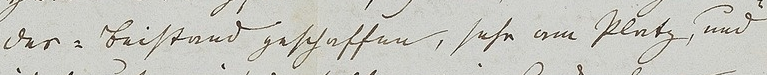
des-Beistand geschaffen, sehr am Platz, und
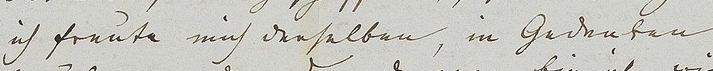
ich freute mich derselben, in Gedanken
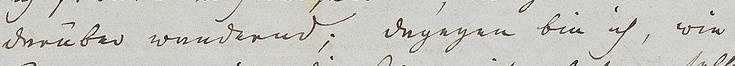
darüber wandernd; dagegen bin ich, wie
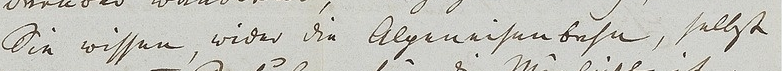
Sie wissen, wider die Alpeneisenbahn, selbst
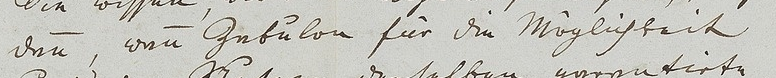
dann, wenn Zebulon für die Möglichkeit
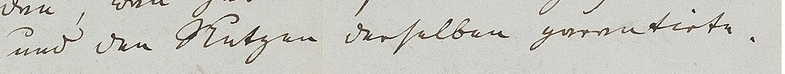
und den Nutzen derselben garantirte.
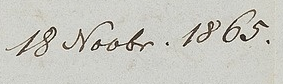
18 Novbr. 1865.
